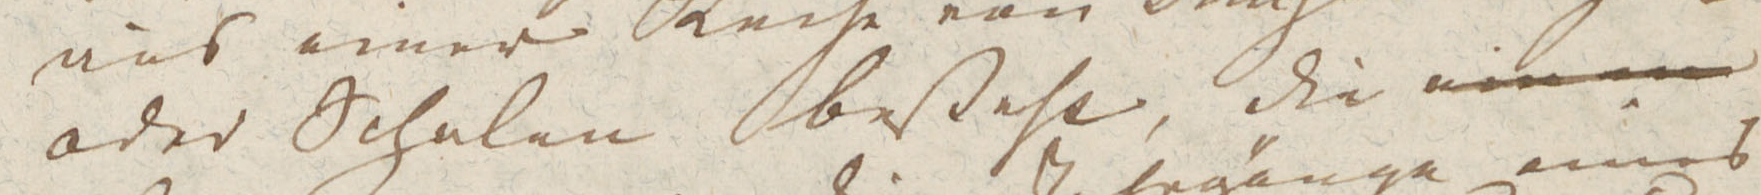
oder Schalen besteht, die einen
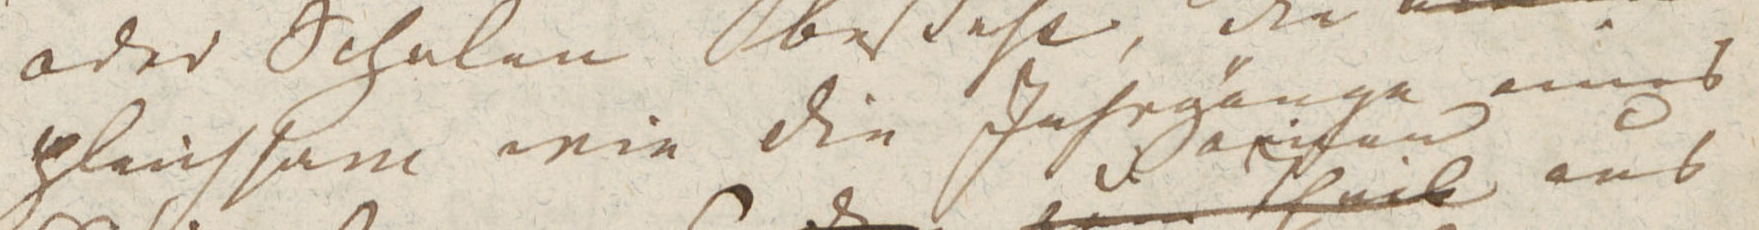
gleichsam wie die Jahrgänge eines
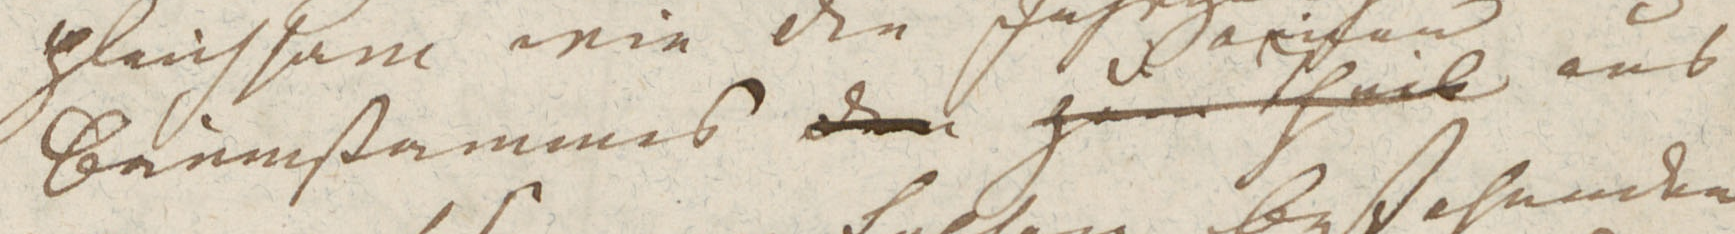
Baumstammes den zum Theil einen aus
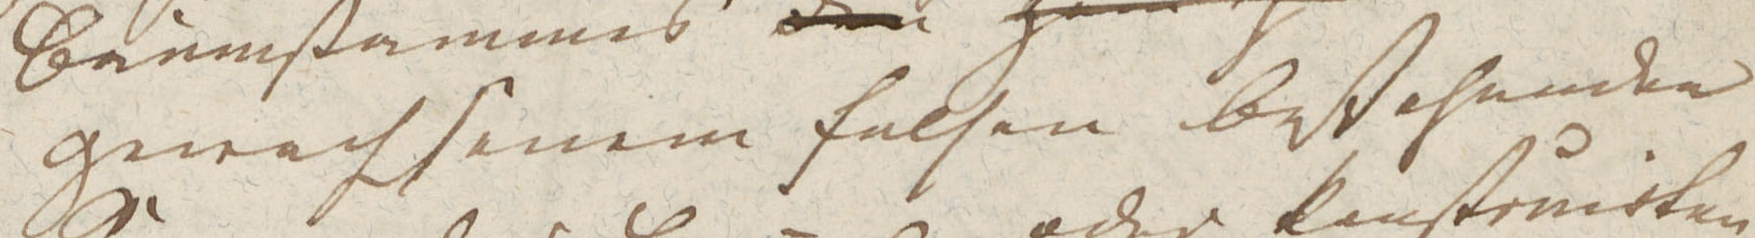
gewachsenem Felsen bestehenden
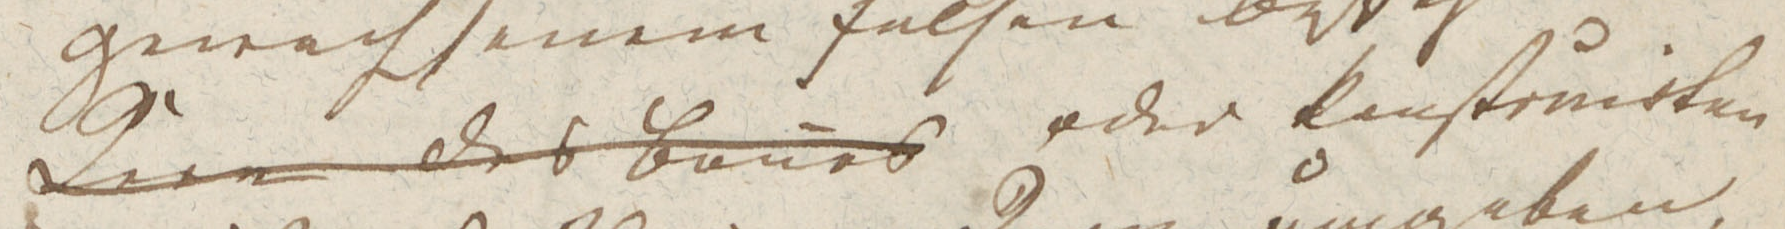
Kern des Baues oder konstruirten
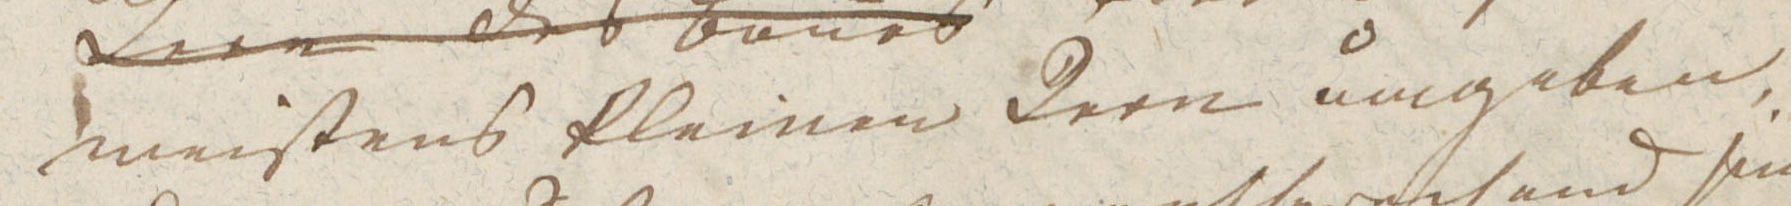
meistens kleinen Kern umgeben.
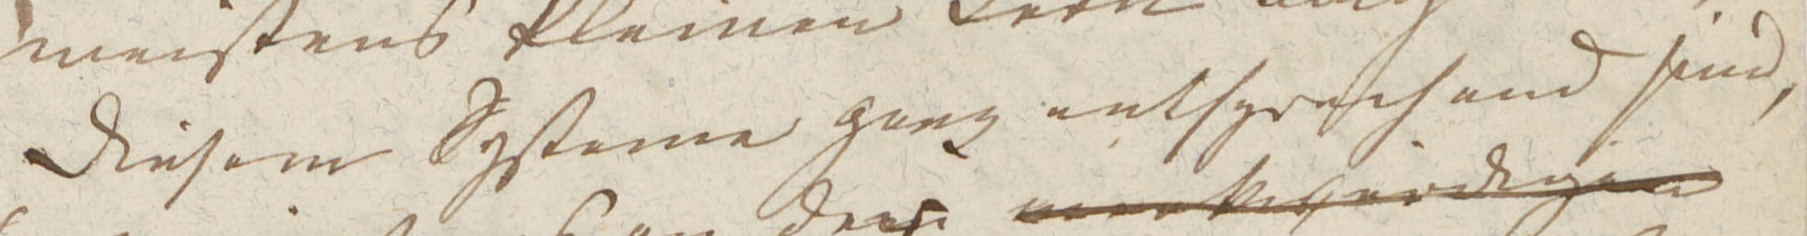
Diesem Systeme ganz entsprechend sind,
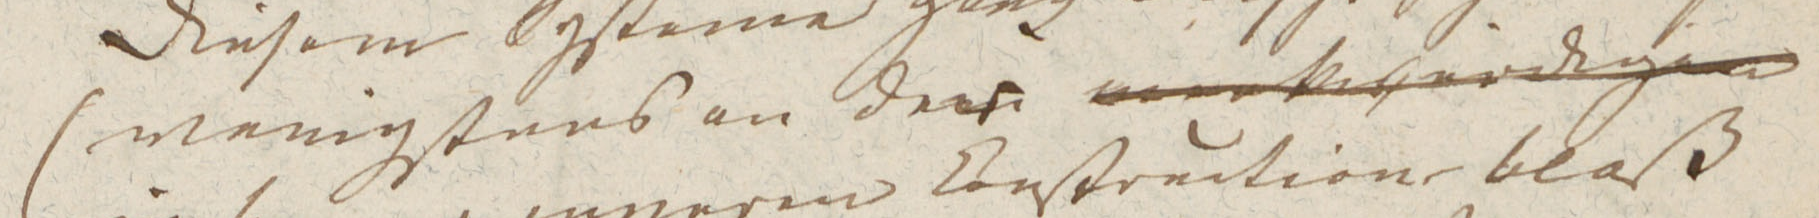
(wenigstens an demr merkwürdigen
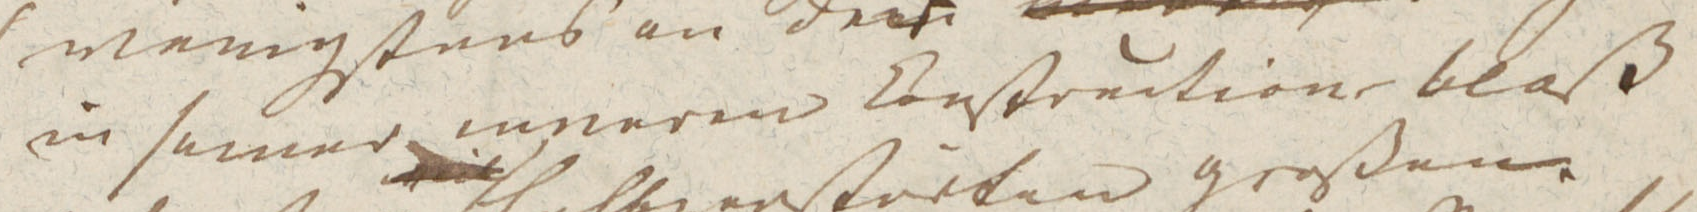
in seiner inneren Construction bloss
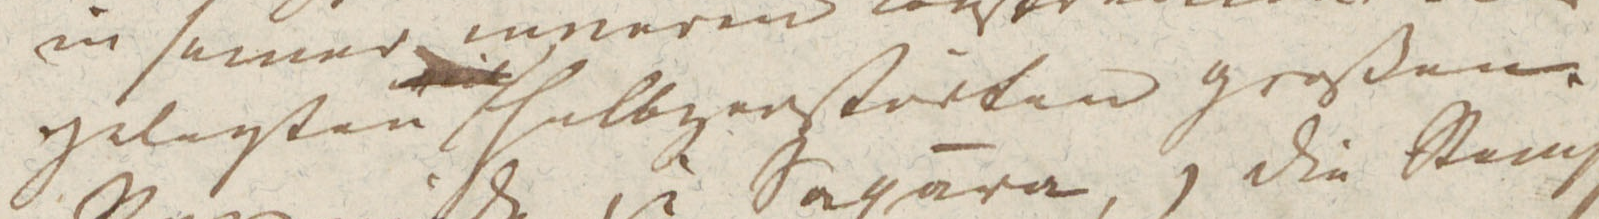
gelegten mit halbzerstörten grossen
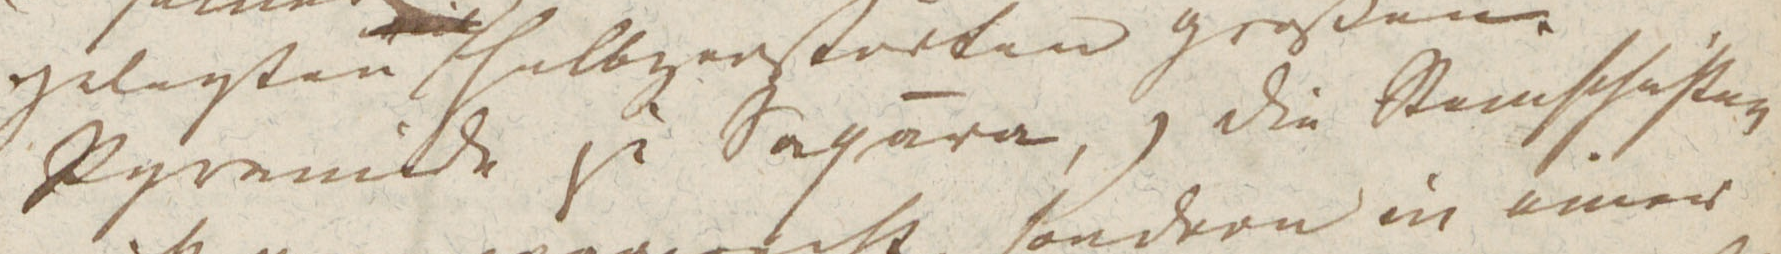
Pyramide zu Saqara,) die Steinschichten
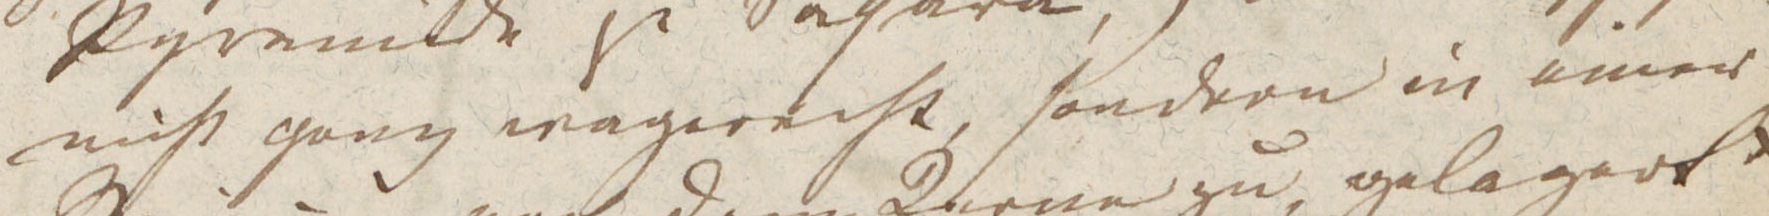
nicht ganz wagerecht, sondern in einer
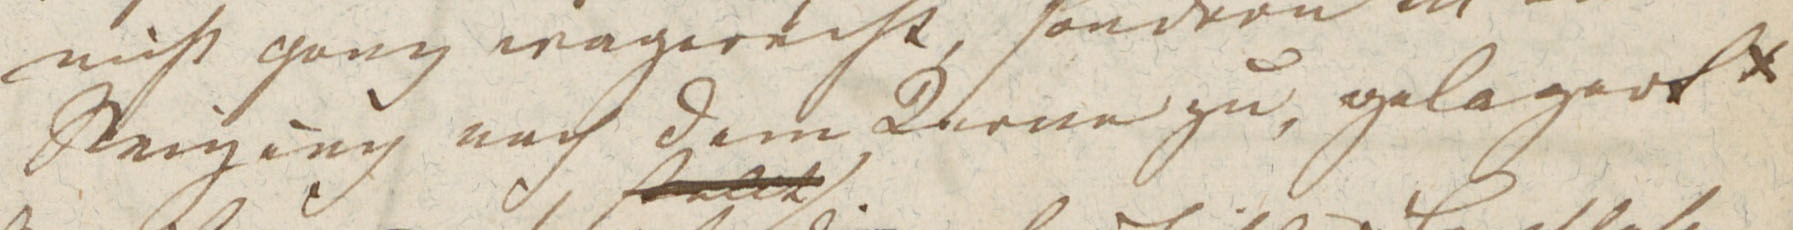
Steigung nach dem Kerne zu, gelagert %
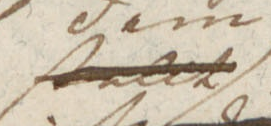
Tempel des
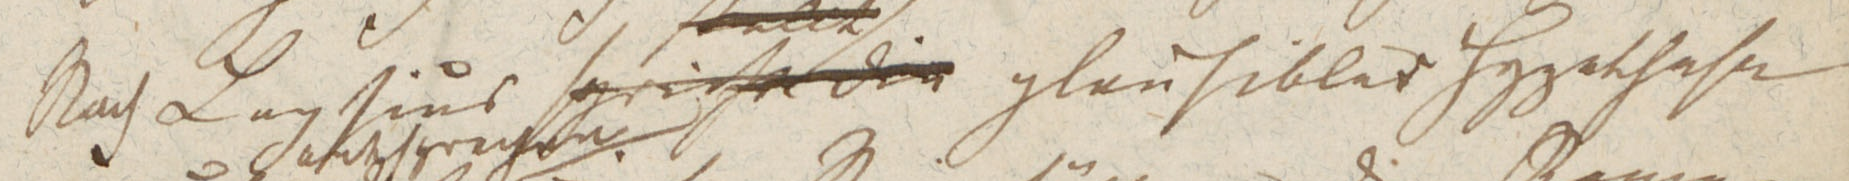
Nach Lepsius spricht die stellt plausibler Hypothese
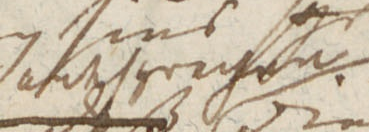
dass entsprechen
